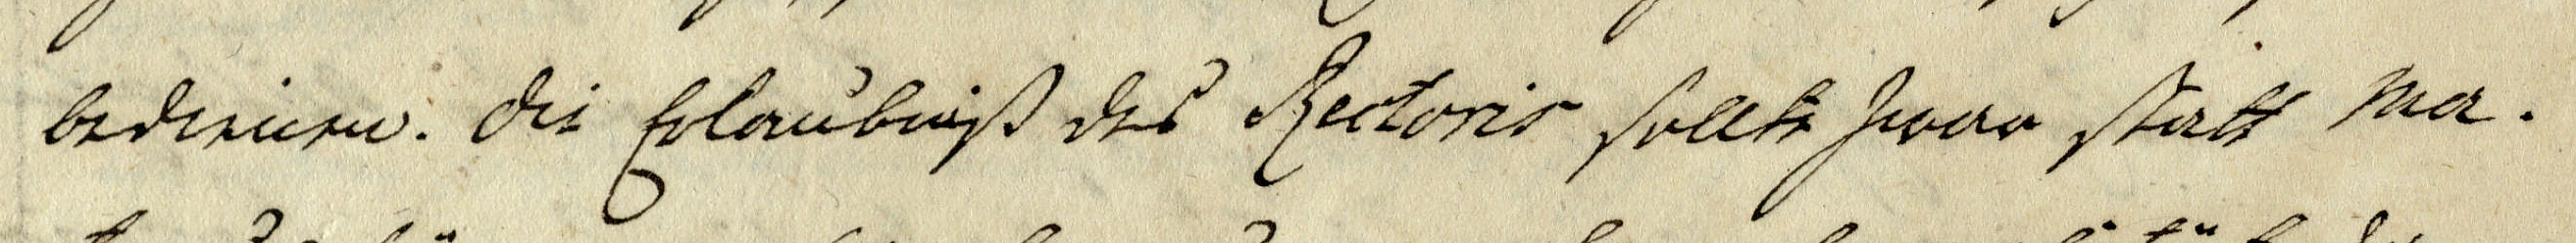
bedienen. Die Erlaubniß des Rectoris sollte zwar statt Ma¬
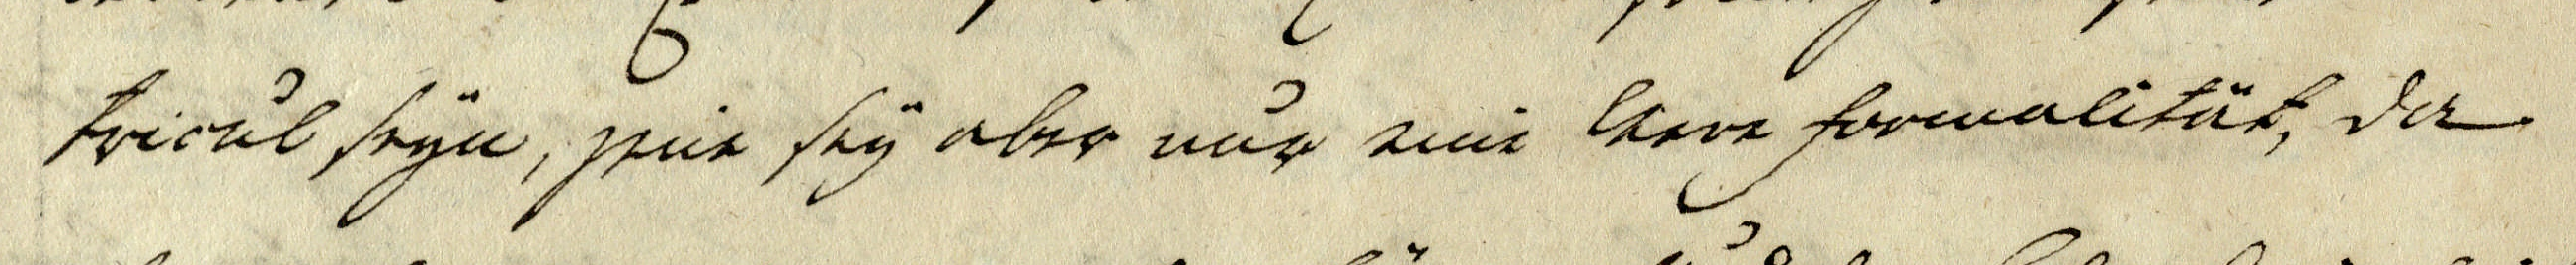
tricul seÿn, jene seÿ aber nur eine eine Formalität, da
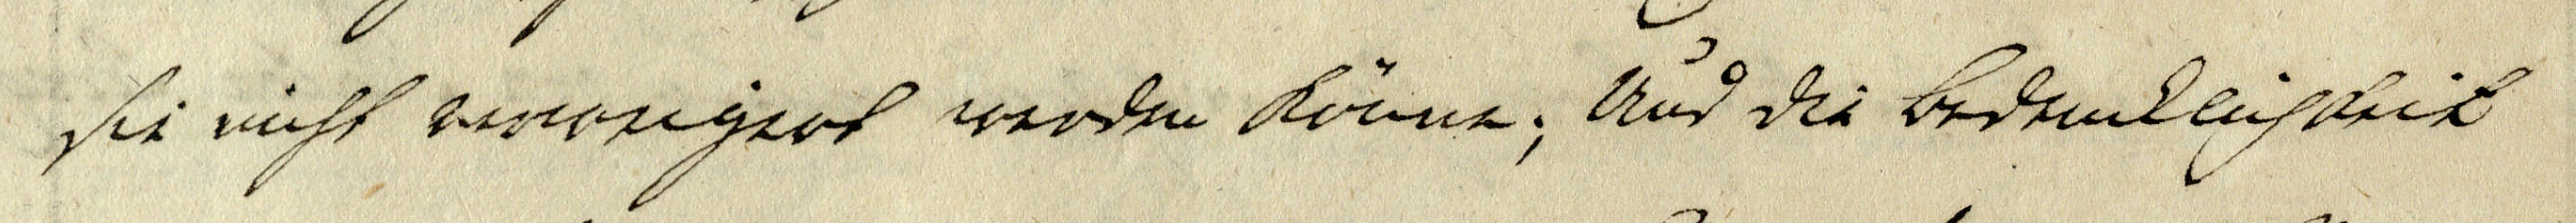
sie nicht verweigert werden könne; Und die Bedencklichkeit
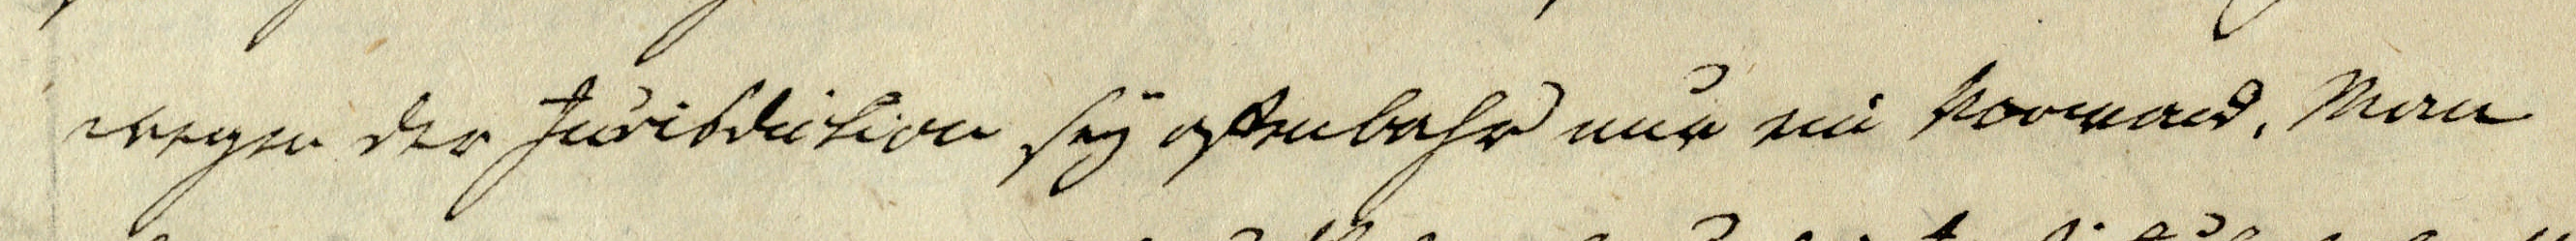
wegen der Jurisdiction seÿ offenbahr nur ein Vorwand, Man
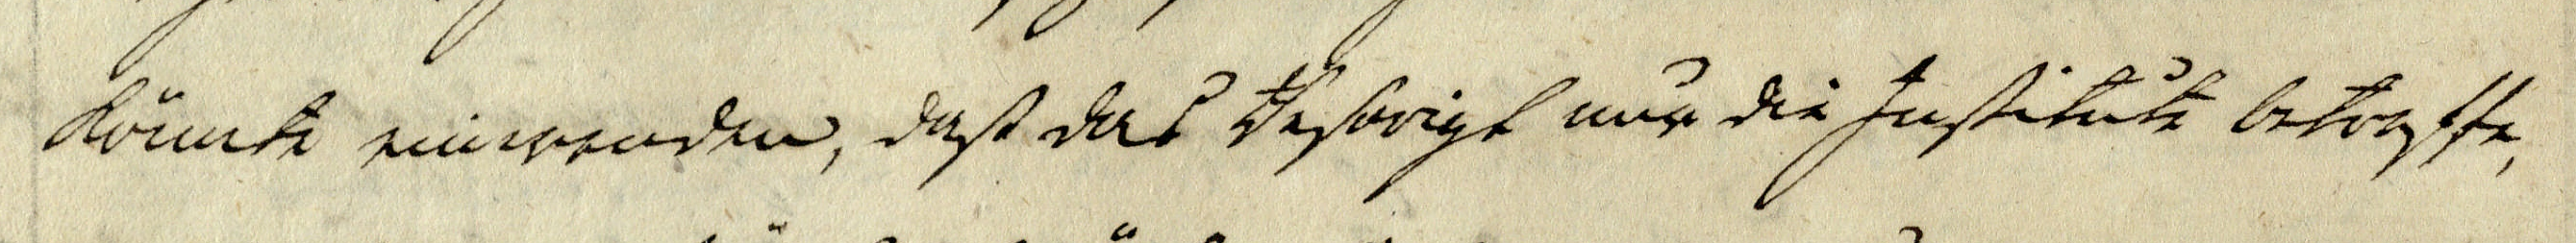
könnte einwenden, daß das Rescript nur die Institute betreffe,
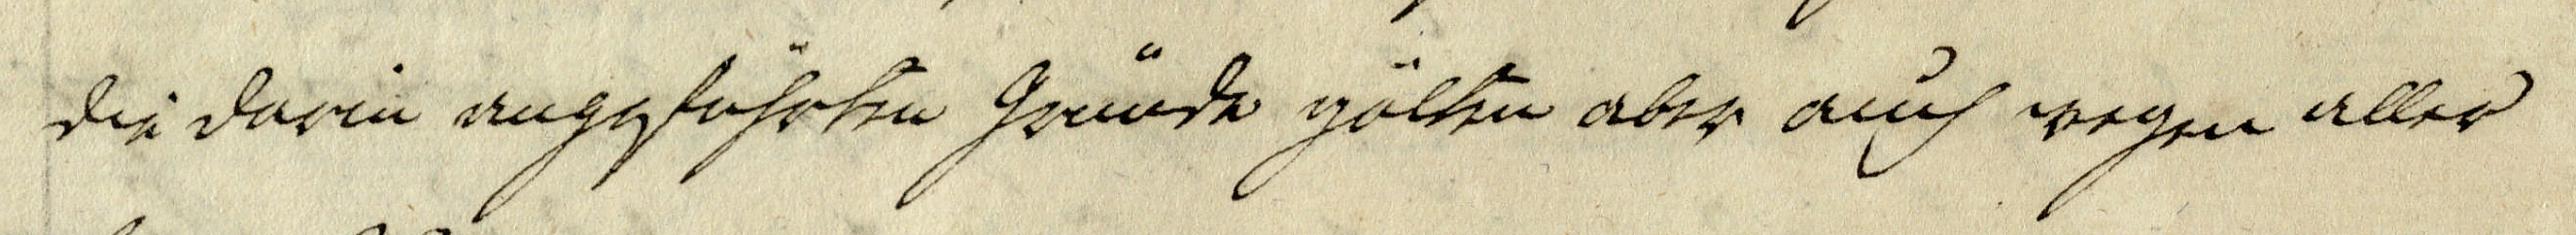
die darin angeführten Gründe gälten aber auch wegen aller
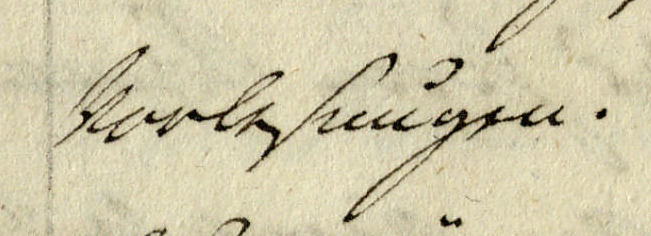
Vorlesungen.
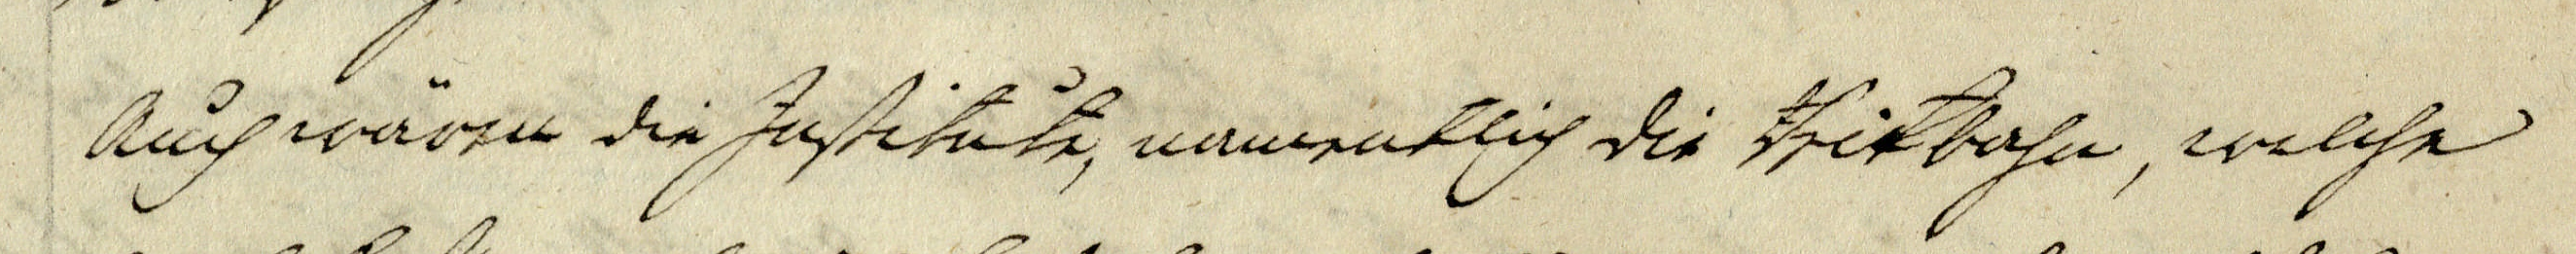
Auch wären die Institute, namentlich die Reitbahn, welche
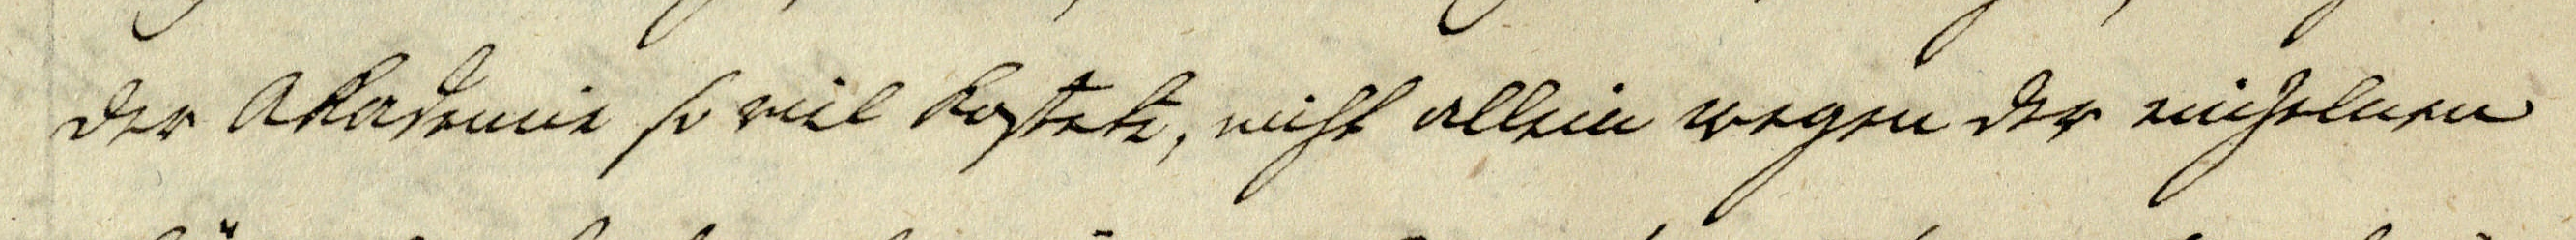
der Akademie so viel kostete, nicht allein wegen der einzelnen
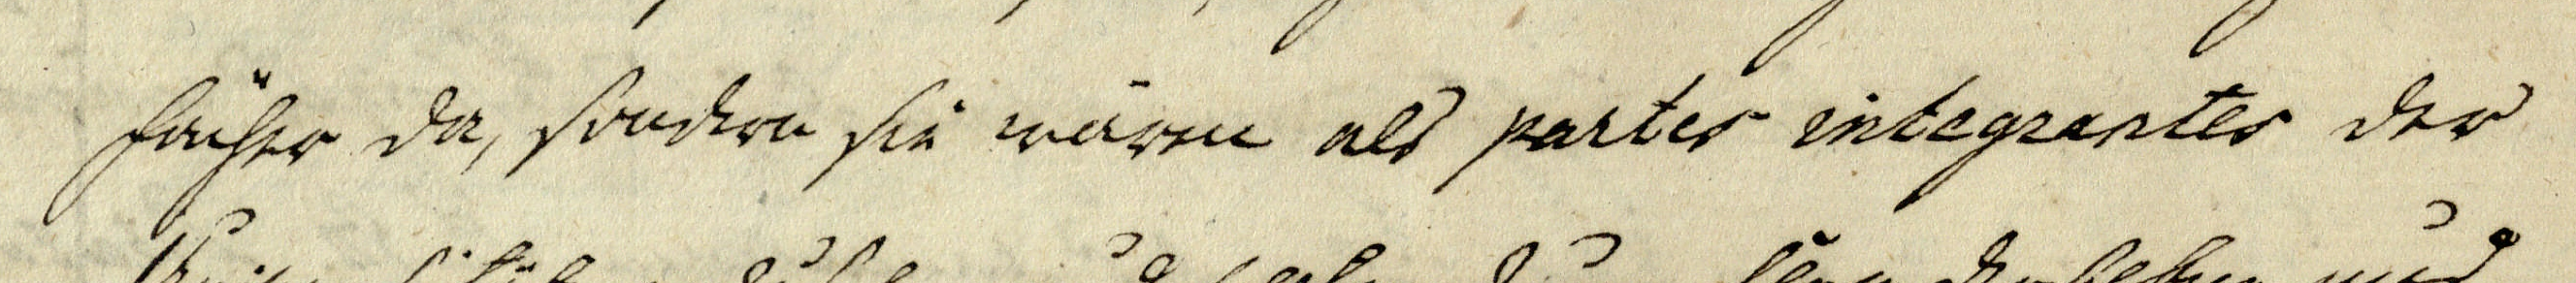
Fächer da, sondern sie wären als partes integrantes der
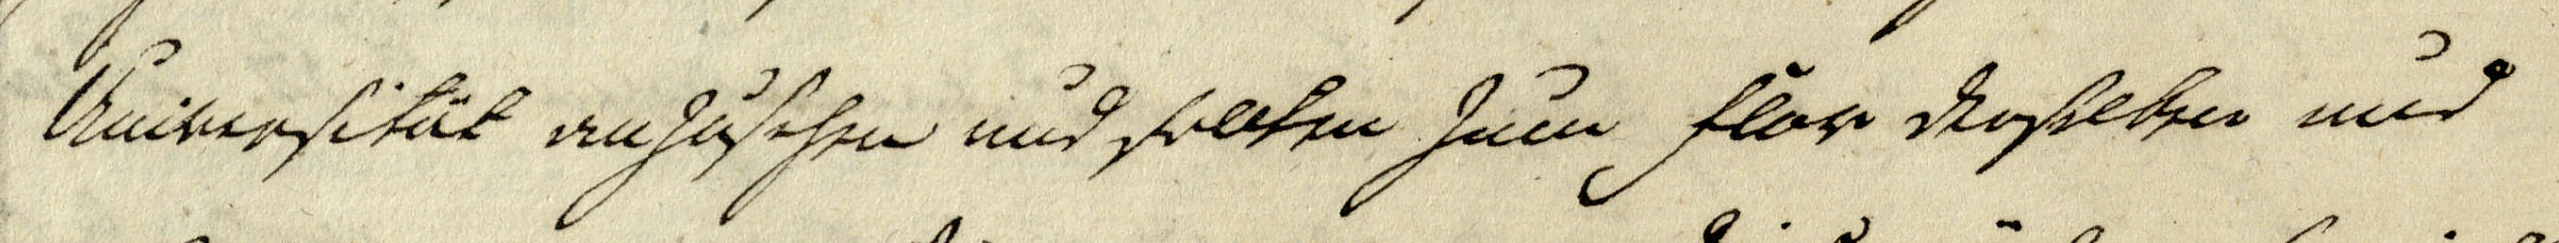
Universität anzusehen und sollten zum Flor derselben und
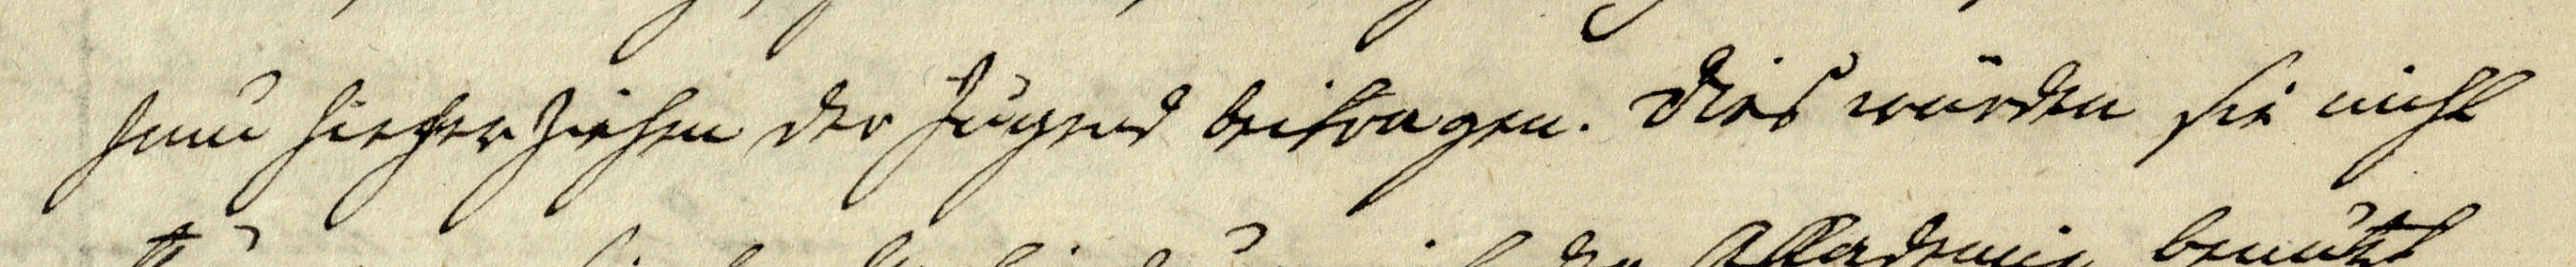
zum hieher Ziehen der Jugend beitragen. Dies würden sie nicht
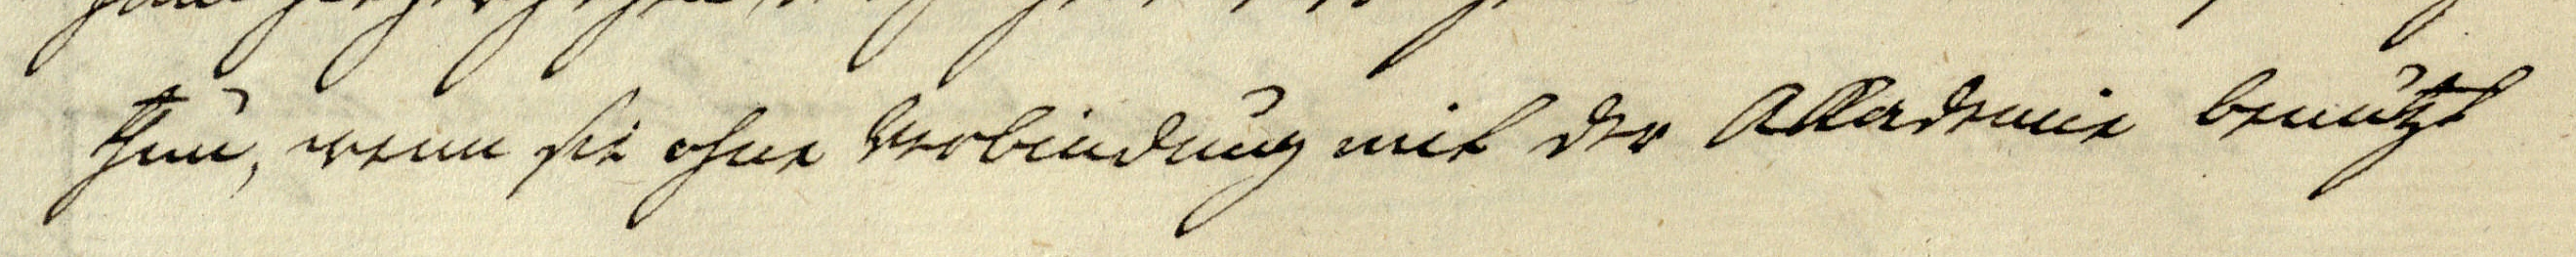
thun, wenn sie ohne Verbindung mit der Akademie benutzt
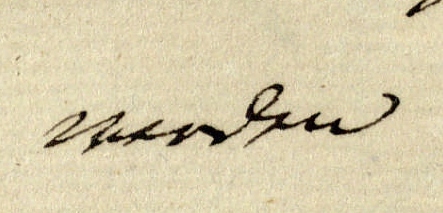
werden
